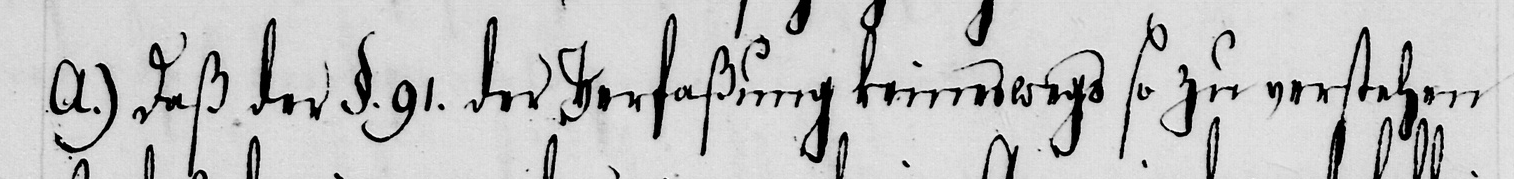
A.) Daß der §. 91. der Verfaßung keineswegs so zu verstehen
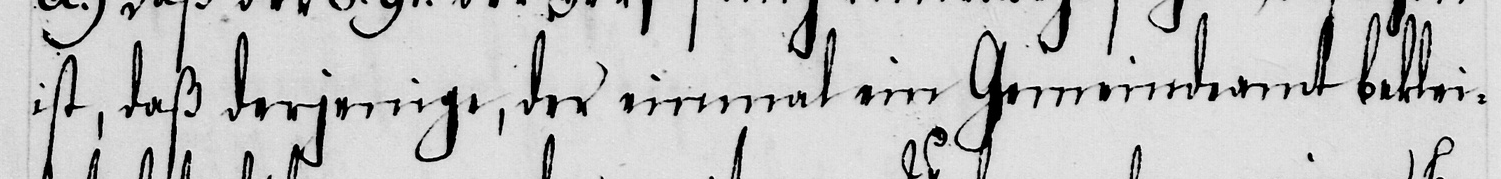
ist, daß derjenige, der einmal ein Gemeindeamt beklei¬
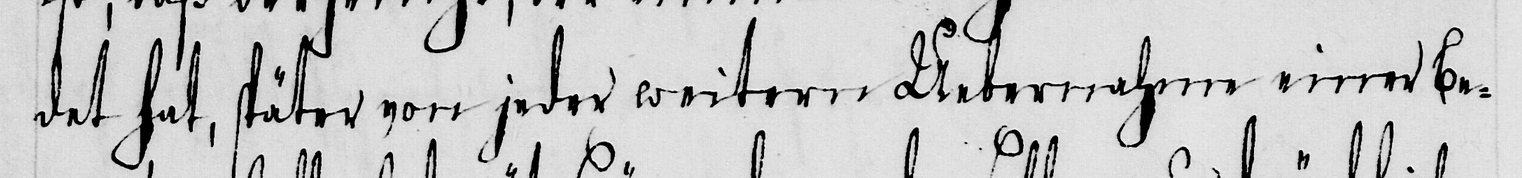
det hat, später von jeder weitern Uebernahme einer Be¬
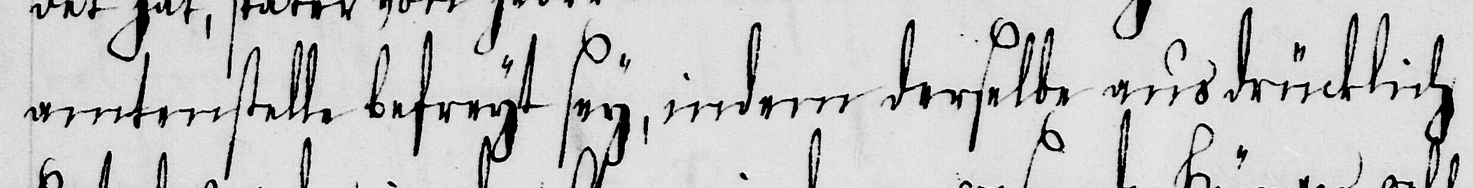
amtenstelle befreyt sey, indem derselbe ausdrücklich
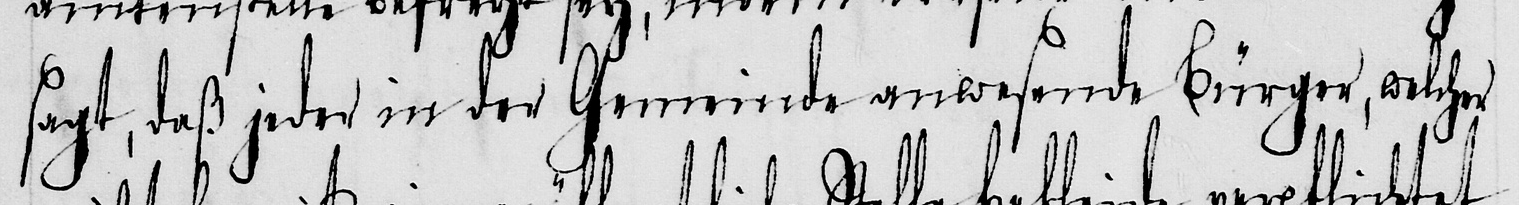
sagt, daß jeder in der Gemeinde anwesende Bürger, welcher
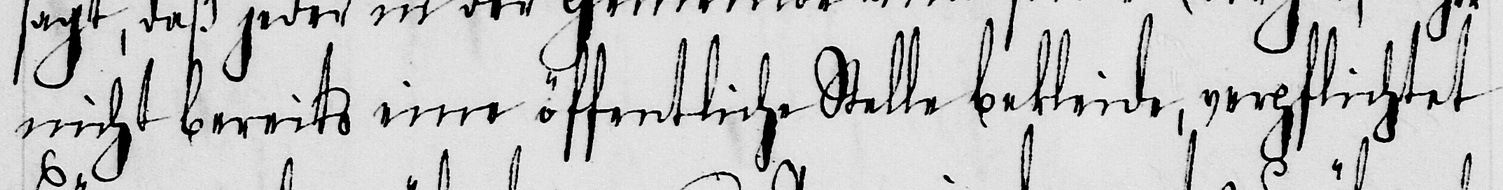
nicht bereits eine öffentliche Stelle bekleide, verpflichtet
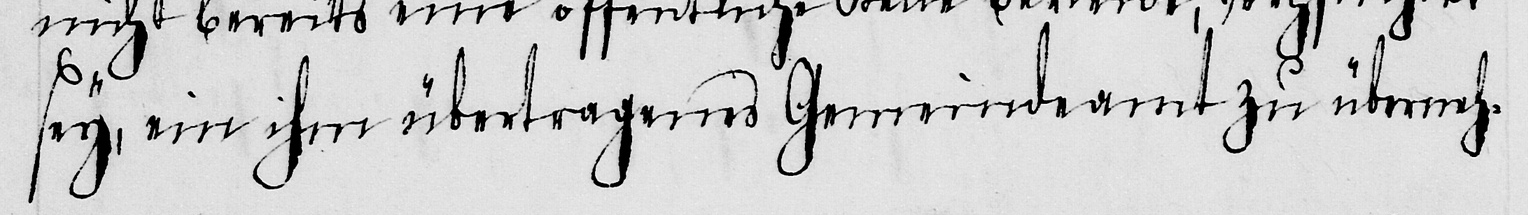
sey, ein ihm übertragenes Gemeindeamt zu überneh¬
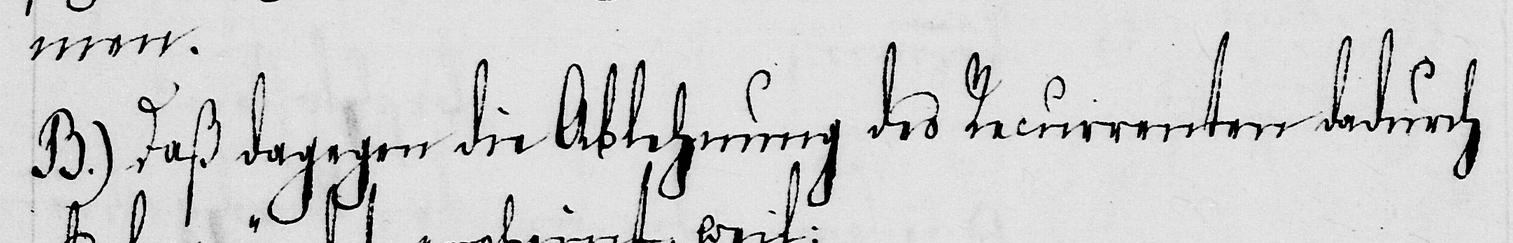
B.) Daß dagegen die Ablehnung des Recurrenten dadurch
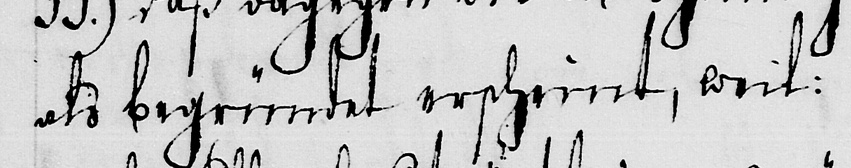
als begründet erscheint, weil:
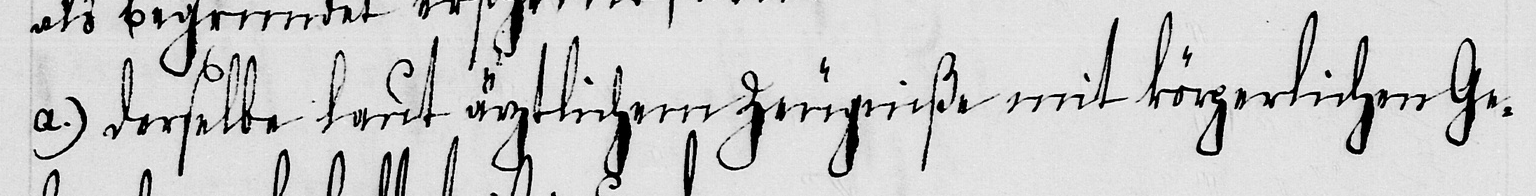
a.) derselbe laut ärztlichem Zeugniße mit körperlichen Ge¬
